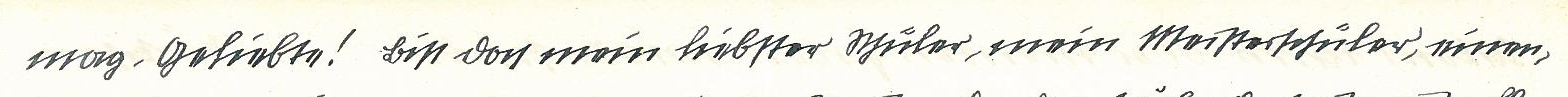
mag, Geliebte! Bist doch mein liebster Schüler, mein Meisterschüler, einen,
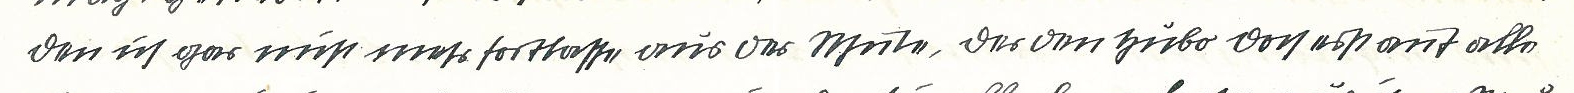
den ich gar nicht mehr fortlasse aus der Schule, der den Hubo doch erst auf alle
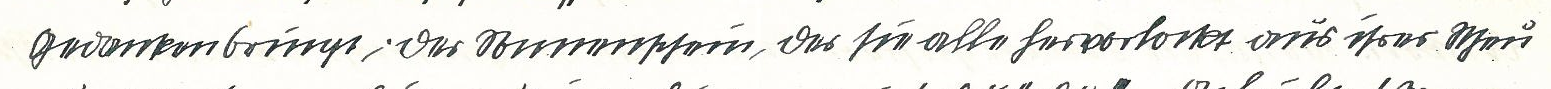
Gedanken bringt; der Sonnenschein, der sie alle hervorlockt aus ihrer Scheu
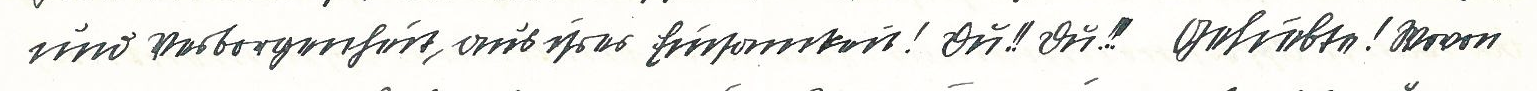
und Verborgenheit, aus ihrer Einsamkeit! Du!! Du!!! Geliebte! Wovon
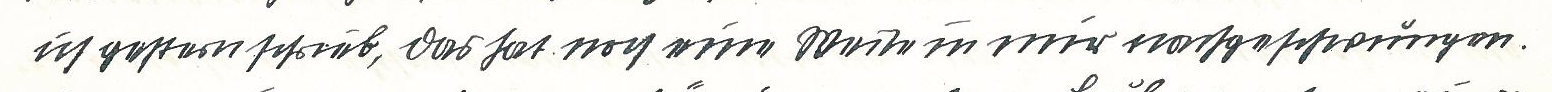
ich gestern schrieb, das hat noch eine Weile in mir nachgeschwungen.
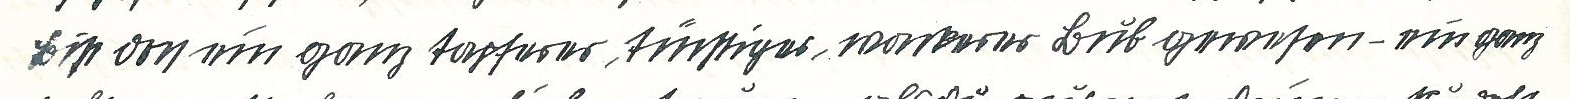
Bist doch ein ganz tapferer, tüchtiger, wackerer Bub gewesen – ein ganz
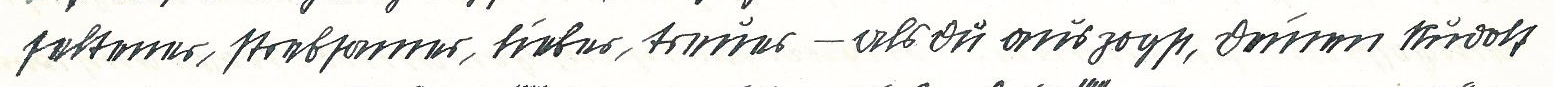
seltener, strebsamer, lieber, treuer – als Du auszogst, Deinen
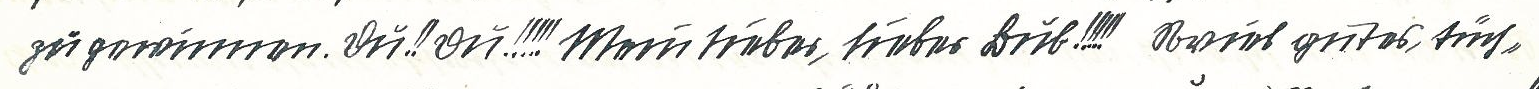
zu gewinnen. Du!! Du!!!!! Mein lieber, lieber Bub!!!! Soviel gutes, tüch¬
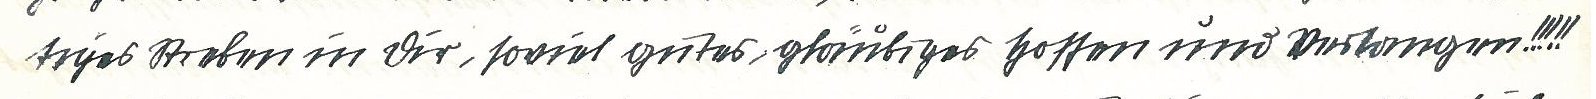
tiges Streben in Dir, soviel gutes, gläubiges Hoffen und Verlangen!!!!!
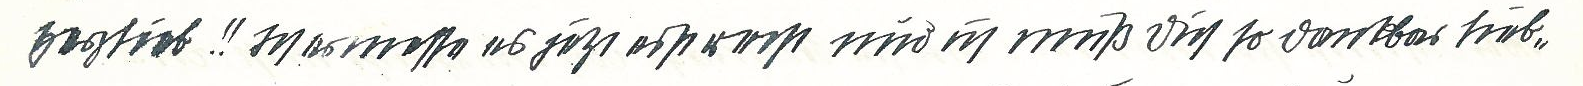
Herzlieb!! Ich ermesse es jetzt erst recht und ich muß Dich so dankbar lieb¬
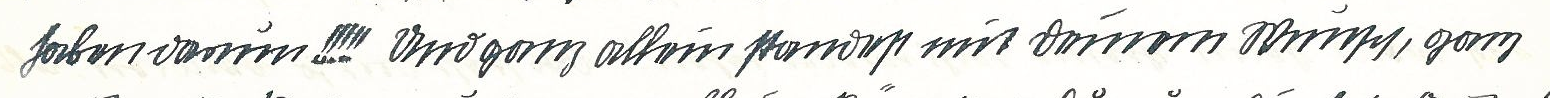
haben, darum!!!!! Und ganz allein standest mit Deinem Wunsch, ganz
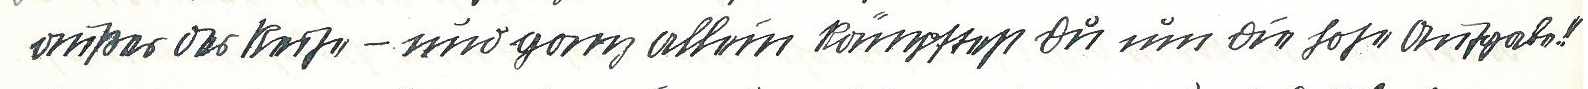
außer der Reihe – und ganz allein kämpftest Du um die hohe Aufgabe!
